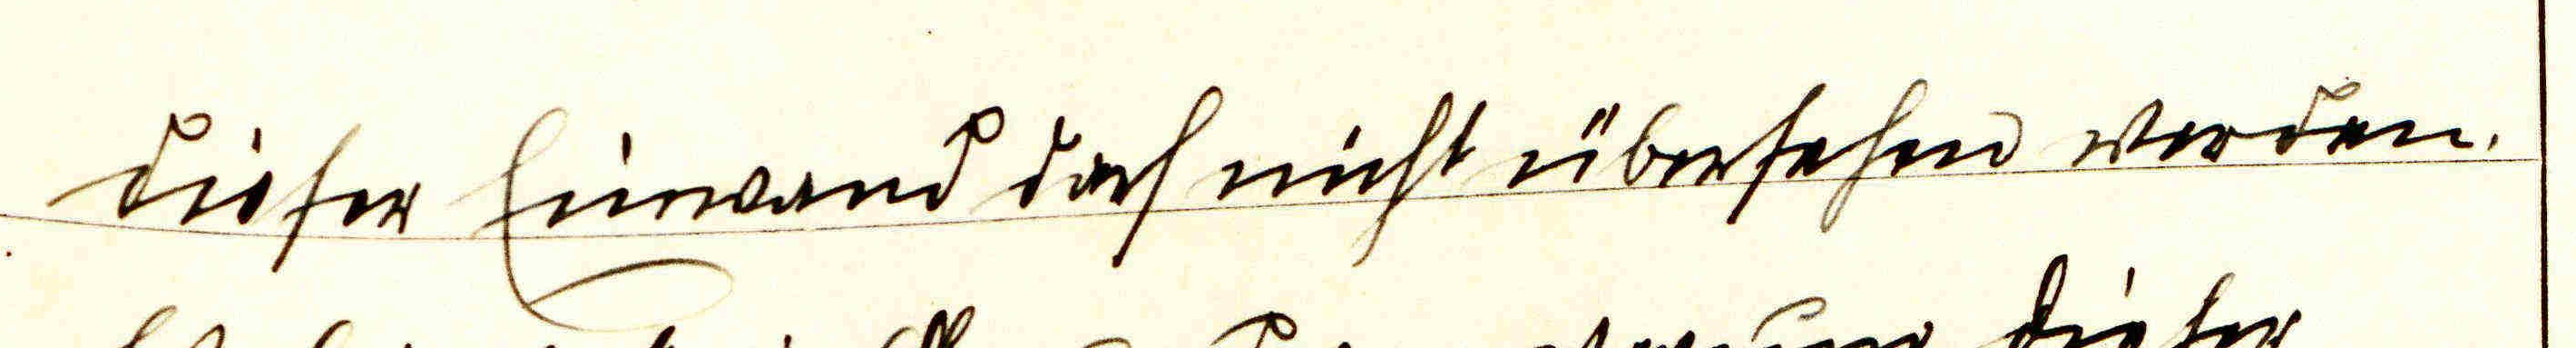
Dieser Einwand darf nicht übersehen werden.
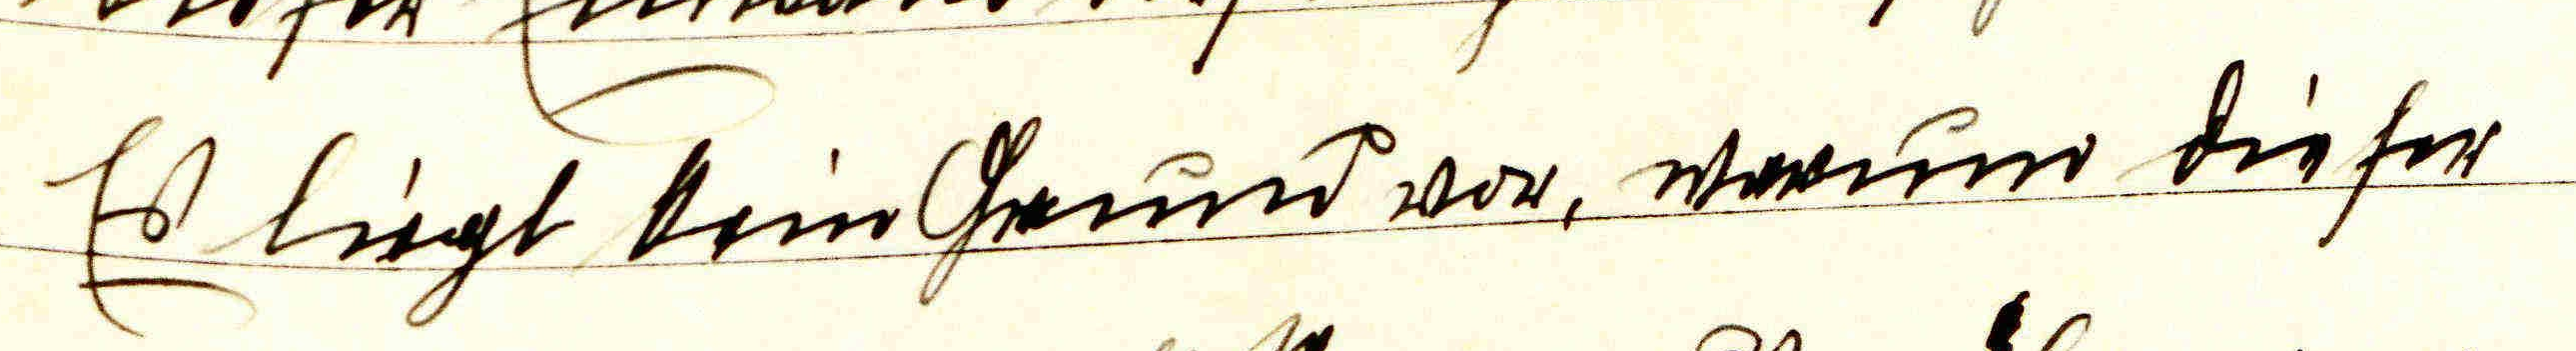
Es liegt kein Grund vor, warum dieser
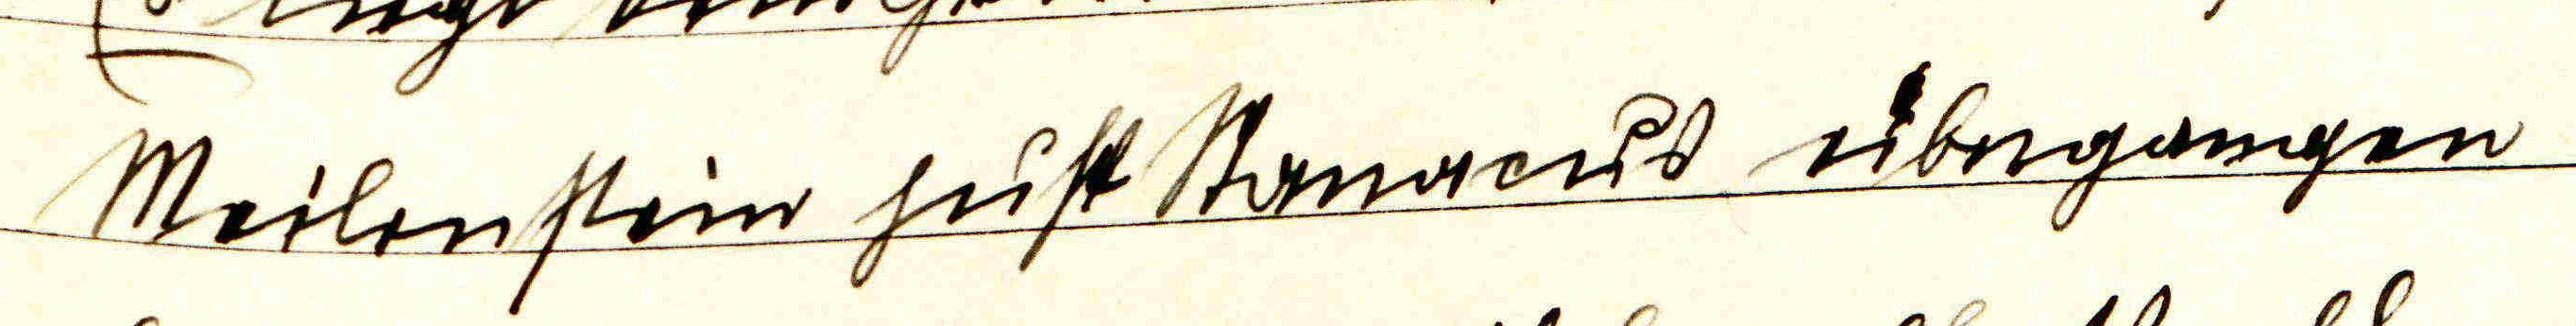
Meilenstein hust Stanacus übergangen
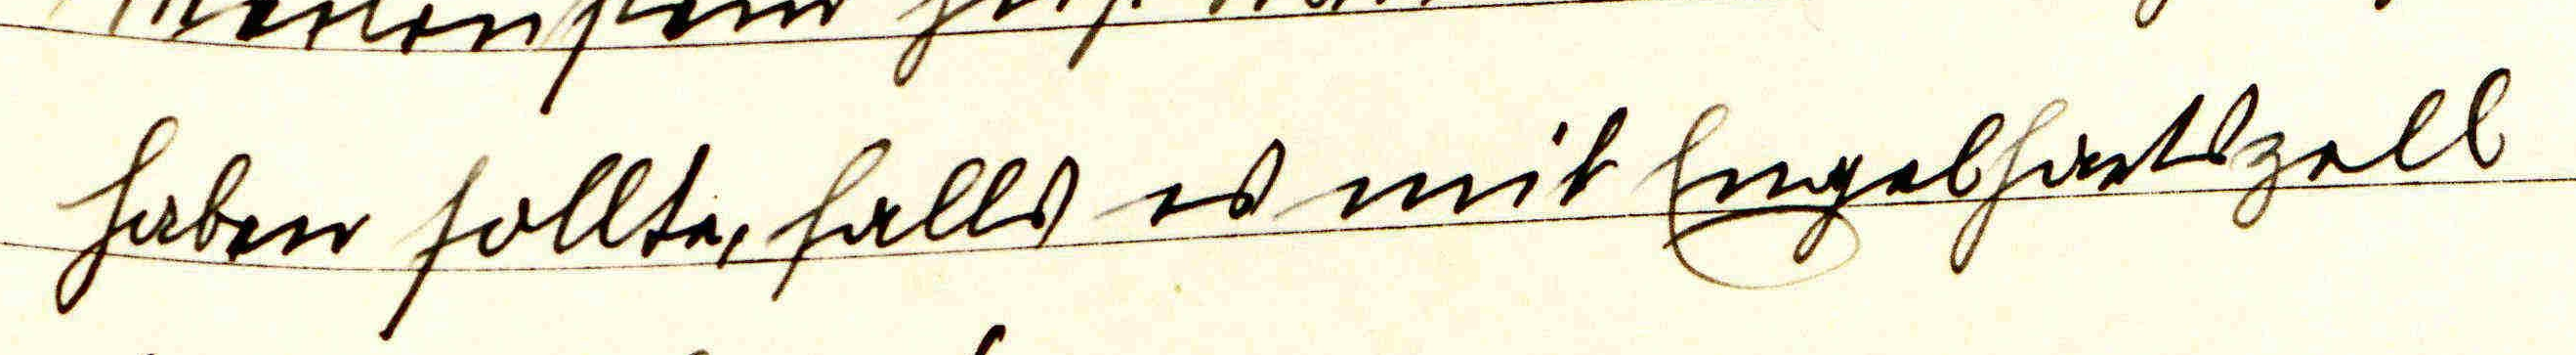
haben sollte, falls es mit Engelhartszell
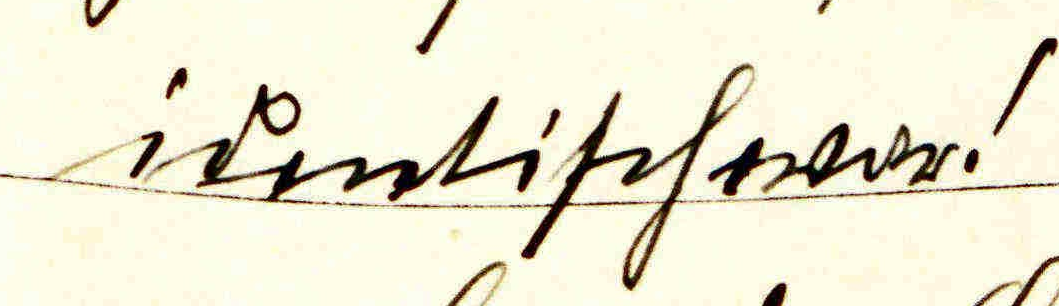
identisch war!
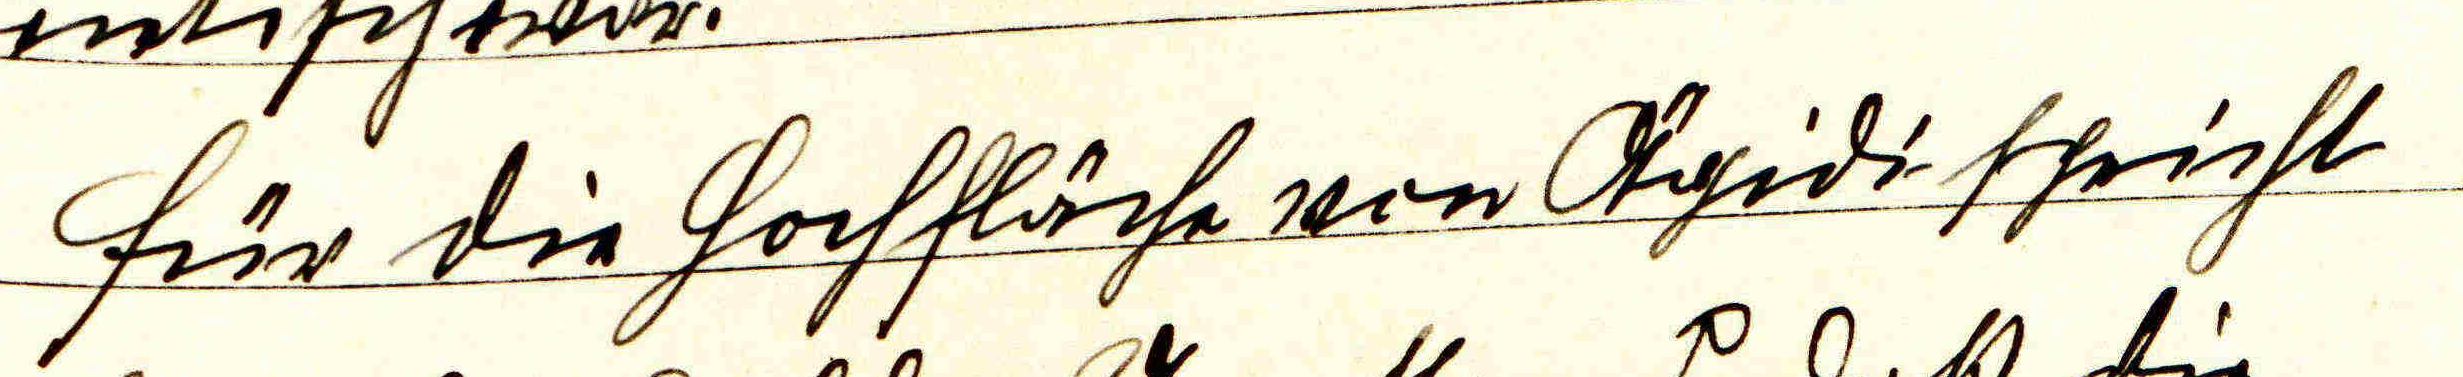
Für die Hochfläche von Ägidi spricht
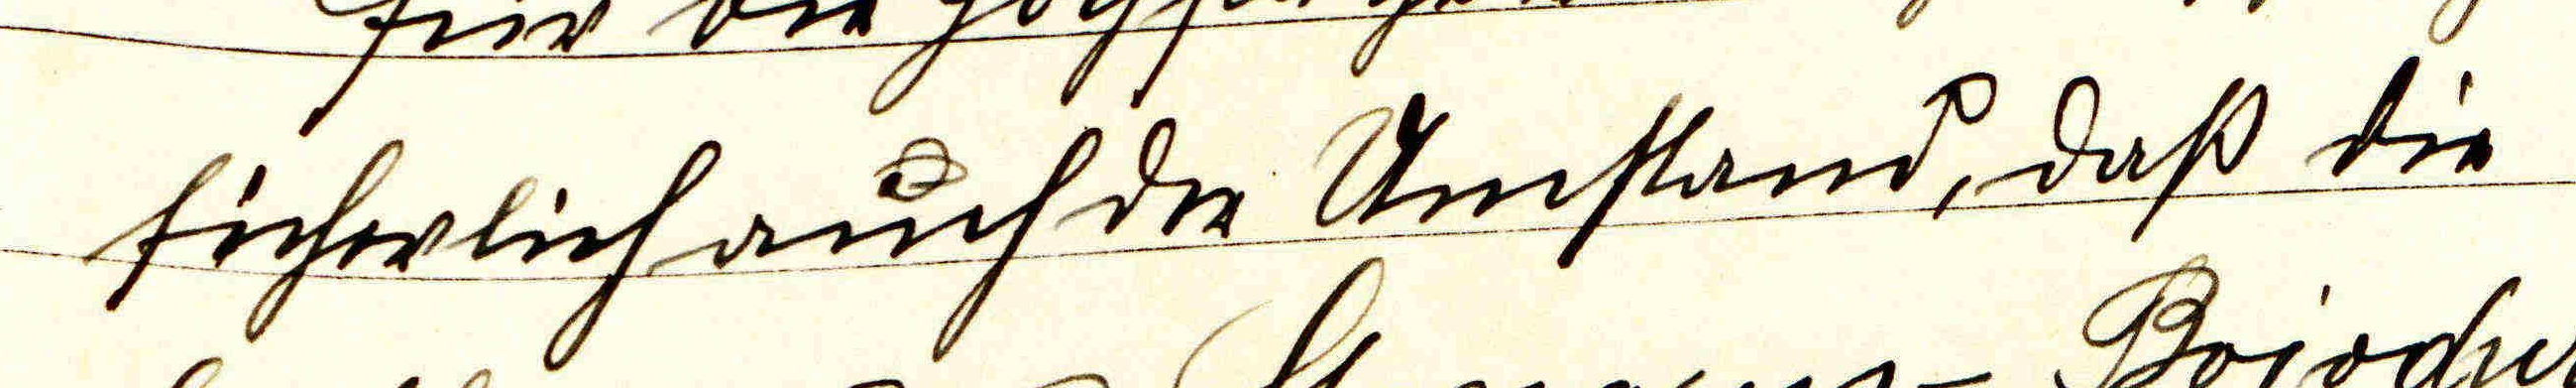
sicherlich auch der Umstand, daß die
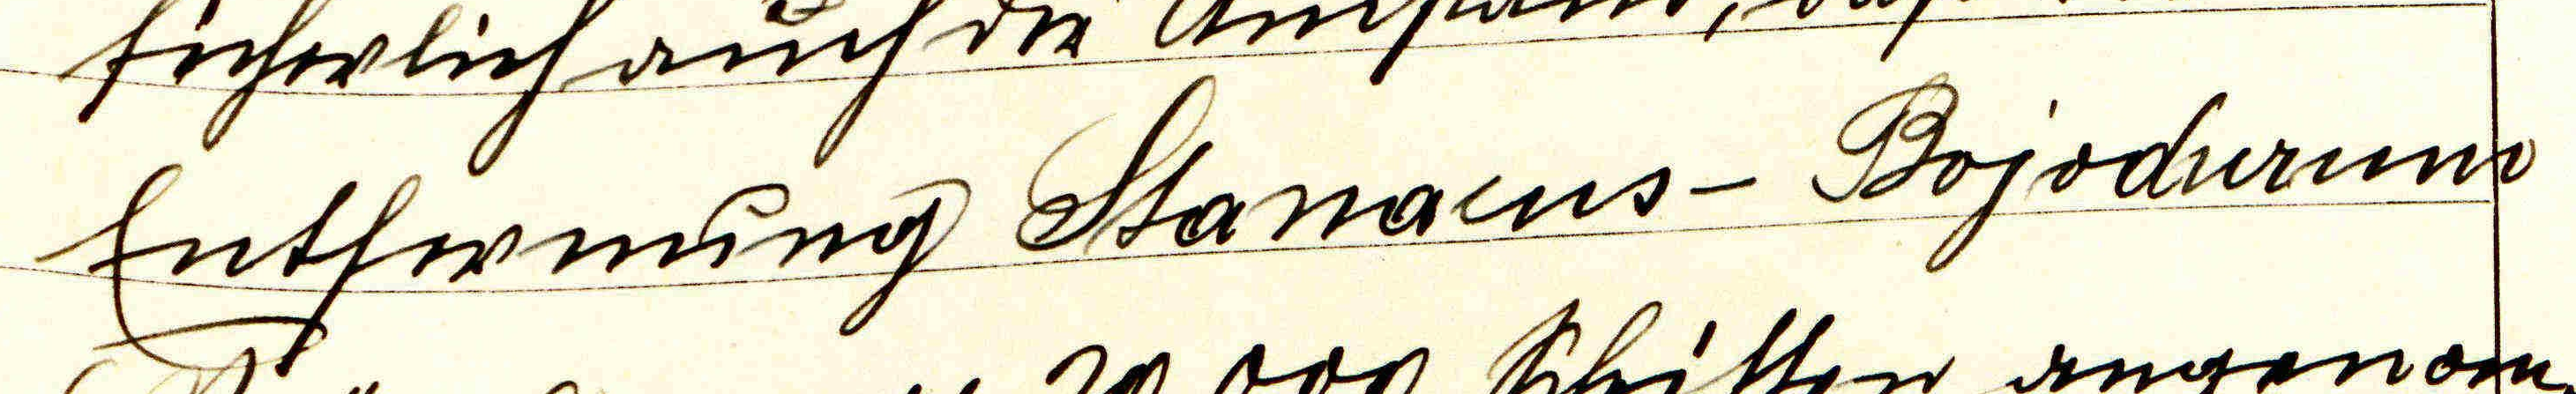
Entfernung Stanacus – Bojodurum
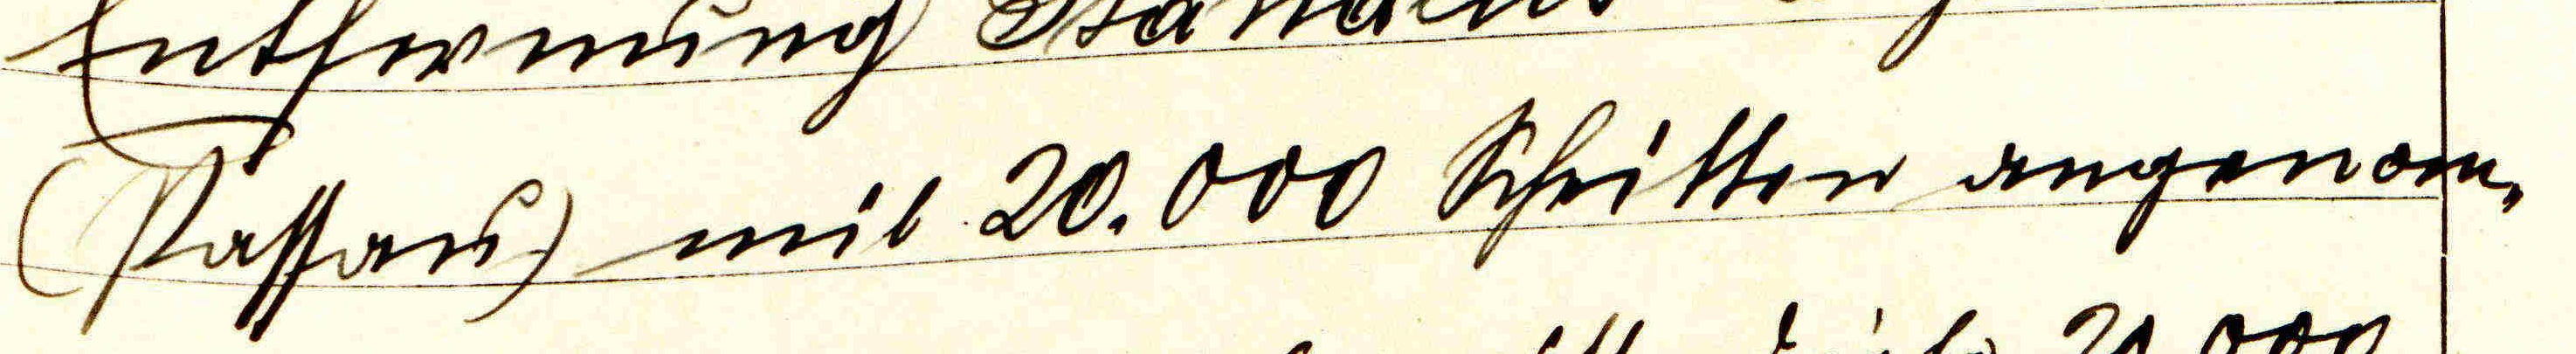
(Passau) mit 20.000 Schritten angenom-
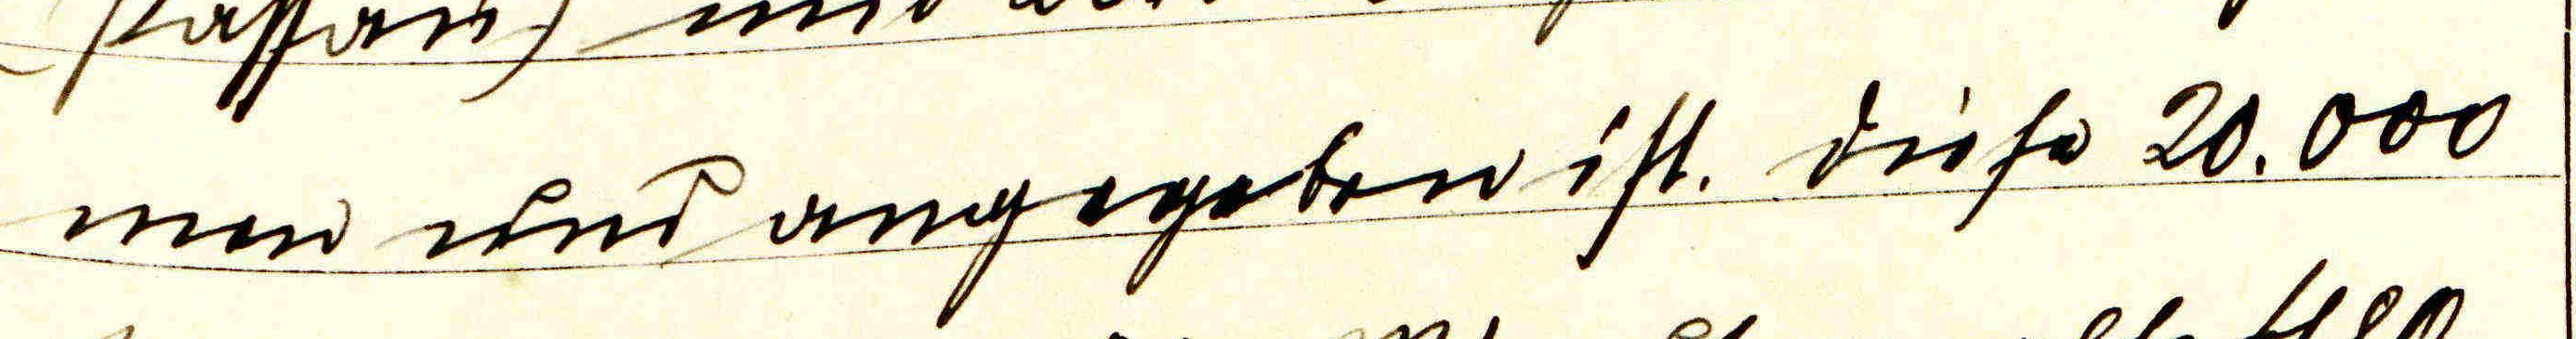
men und angegeben ist. Diese 20.000
